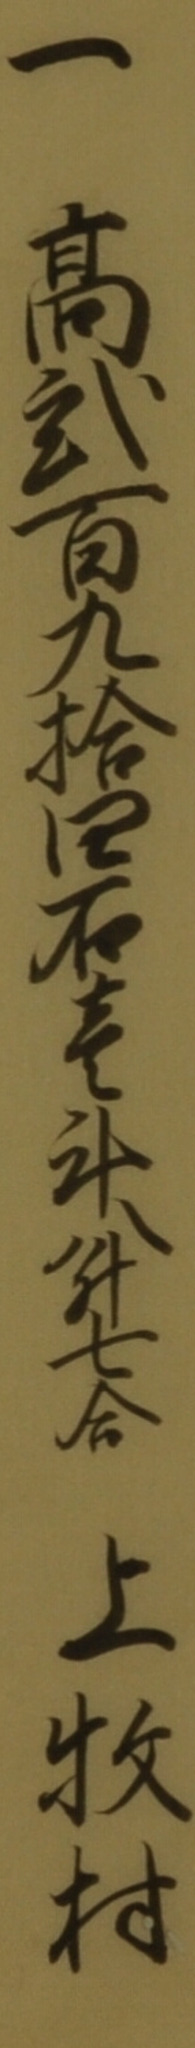一高弐百九拾四石壱斗八升七合上牧村

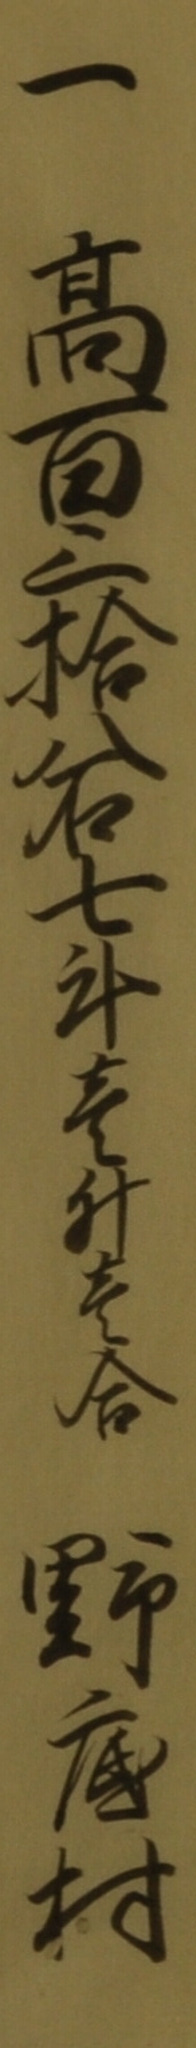一高百三拾八石七斗壱升壱合野底村
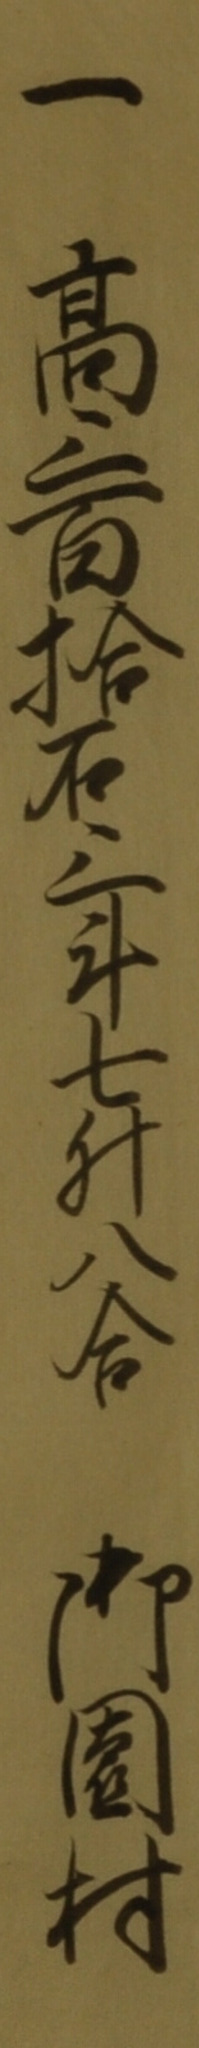一高三百拾石三斗七升八合御園村
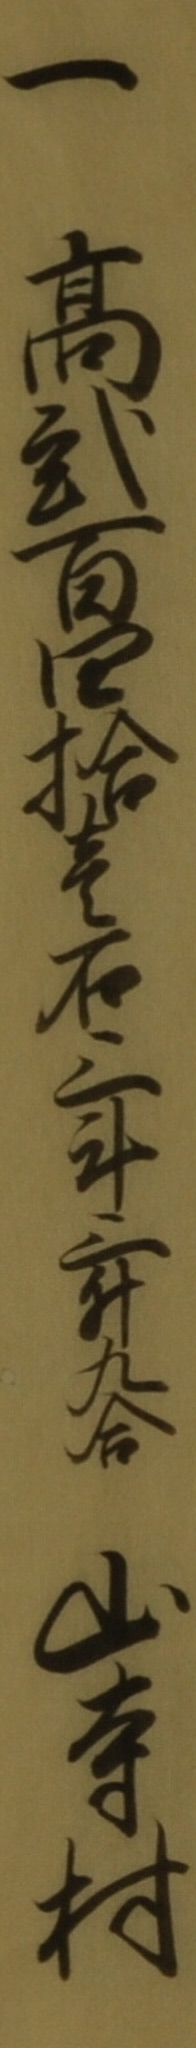一高弐百四拾壱石三斗三升九合山寺村
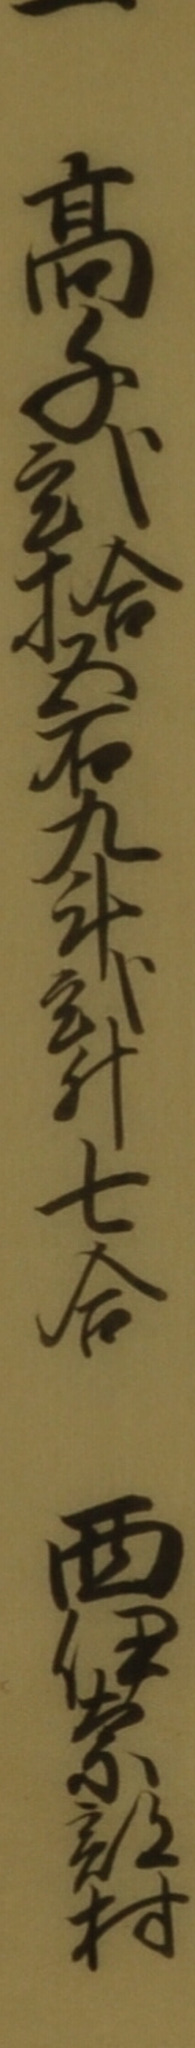一高千弐拾五石九斗弐升七合西伊奈部村
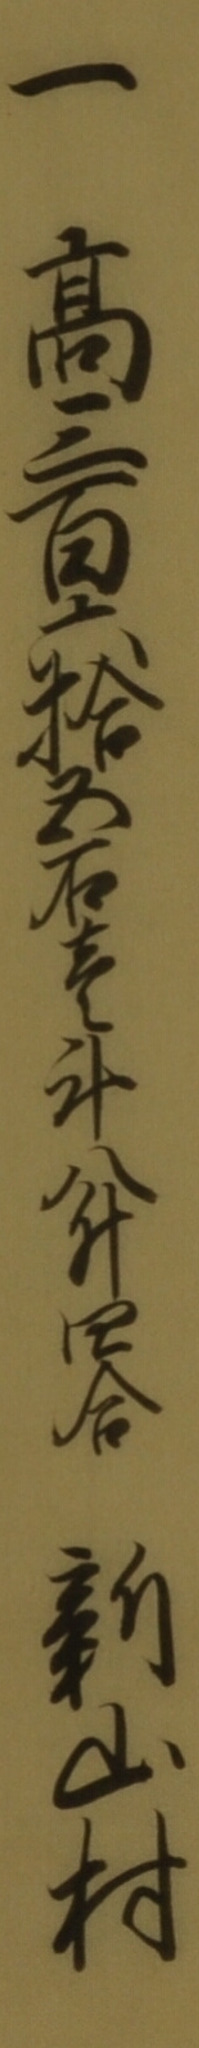一高三百六拾五石壱斗八升四合新山村
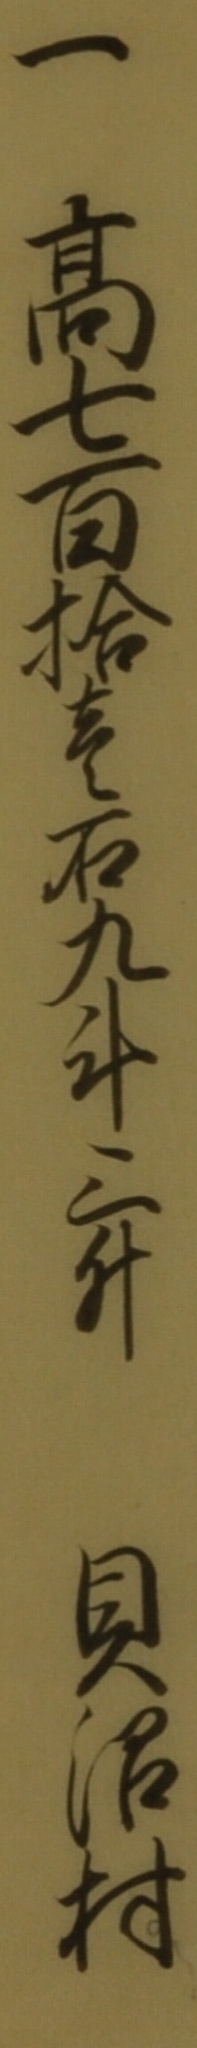一高七百拾壱石九斗三升貝沼村

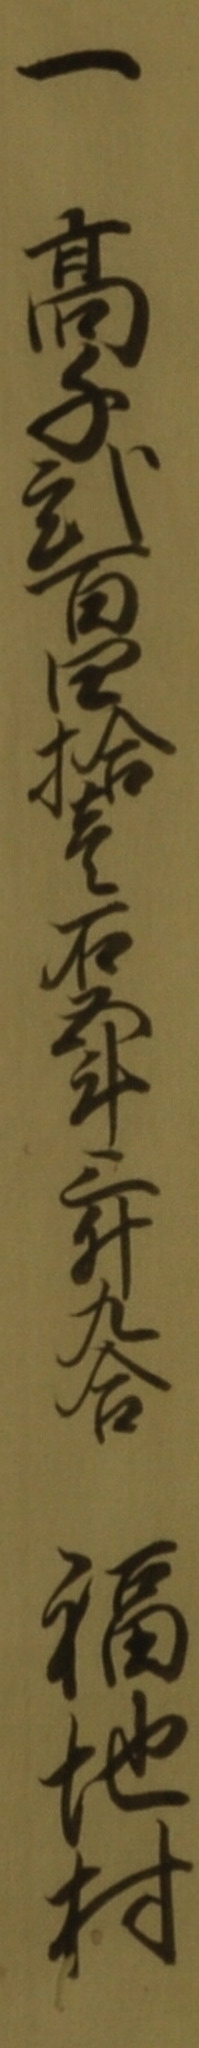一高千弐百四拾壱石五斗三升九合福地村
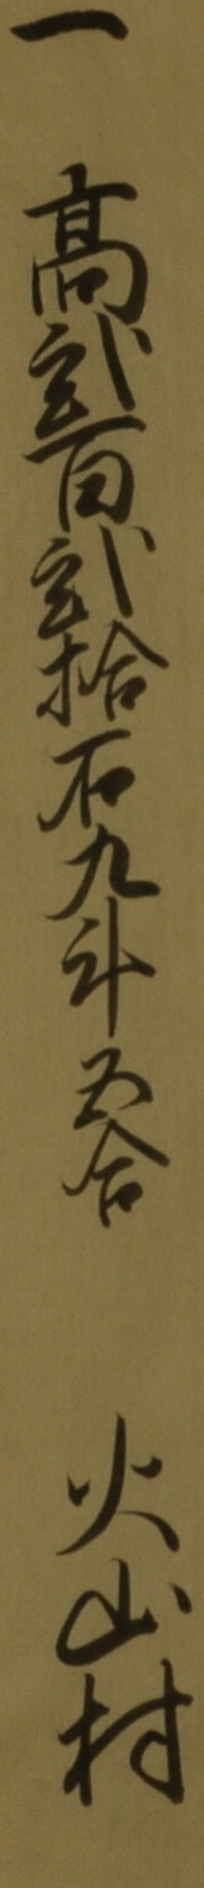一高弐百弐拾石九斗五合火山村
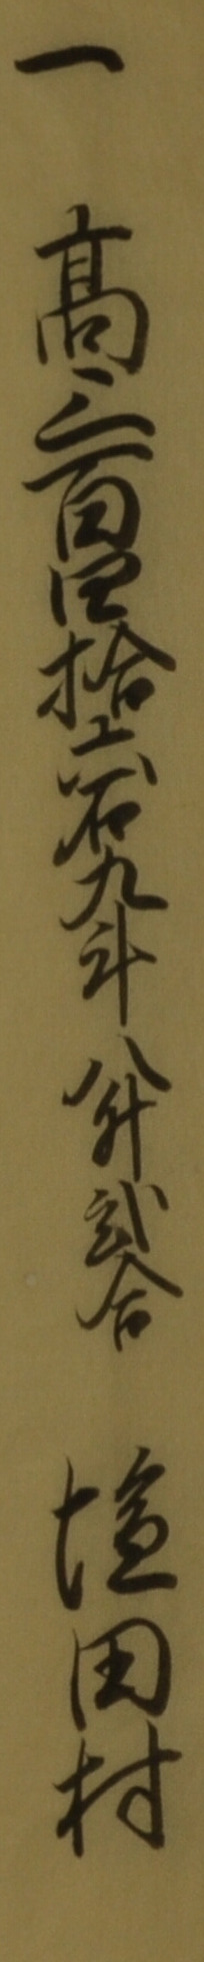一高三百四拾六石九斗八升弐合塩田村
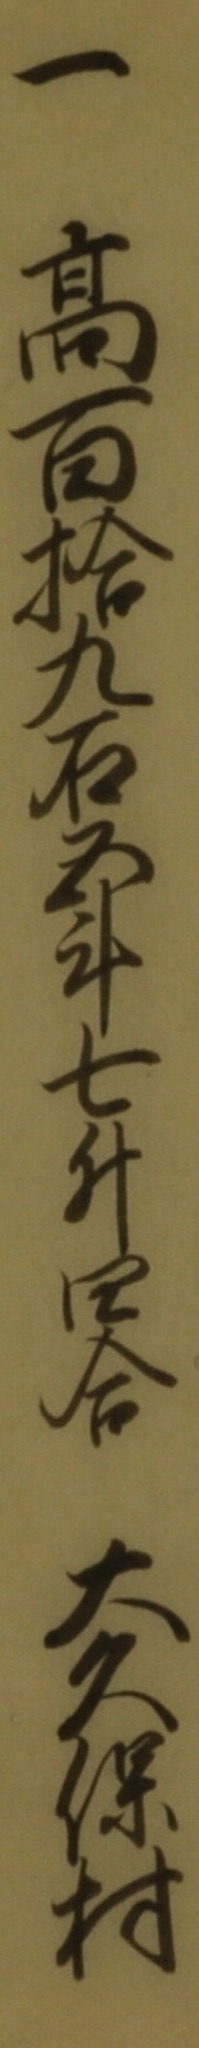一高百拾九石五斗七升四合大久保村
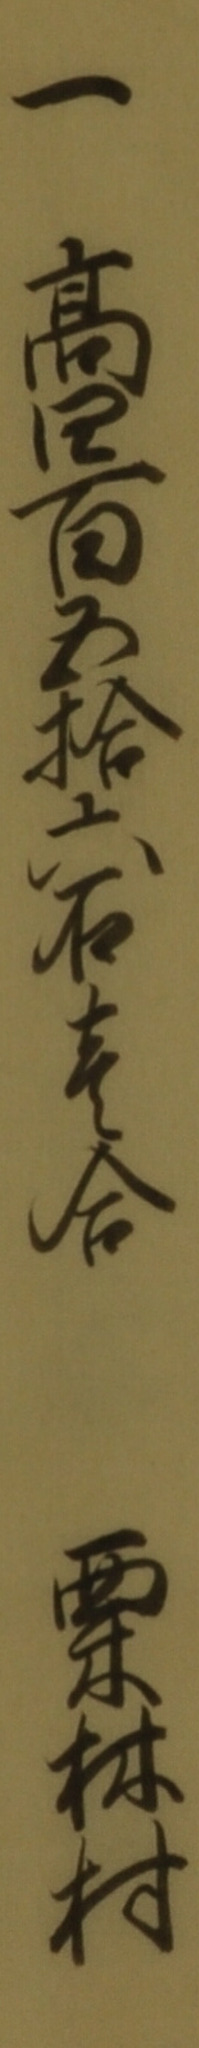一高四百五拾六石壱合栗林村
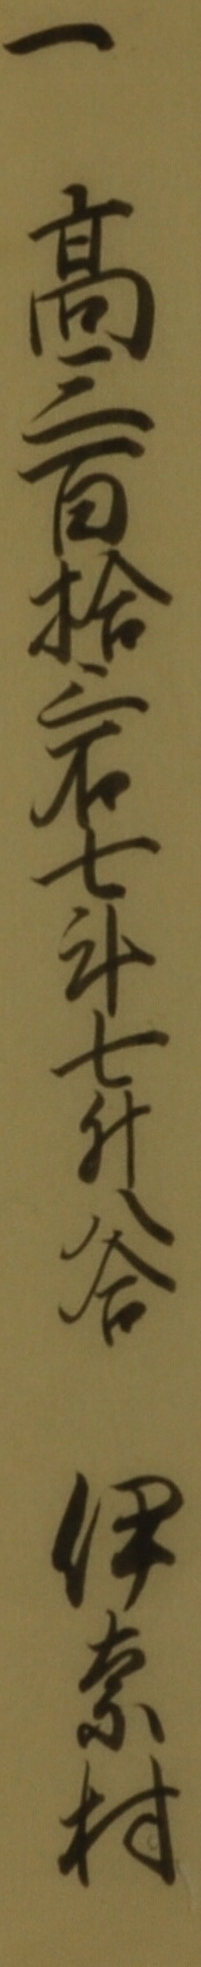一高三百拾三石七斗七升八合伊奈村

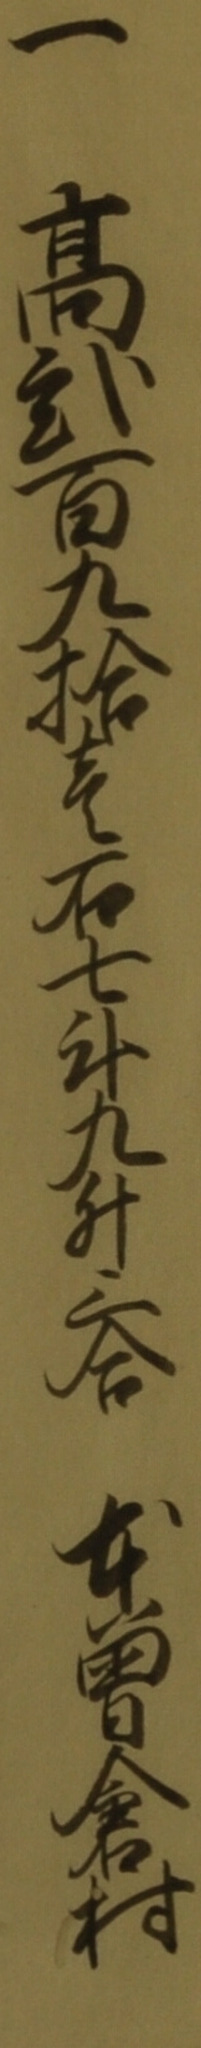一高弐百九拾壱石七斗九升三合本曾倉村
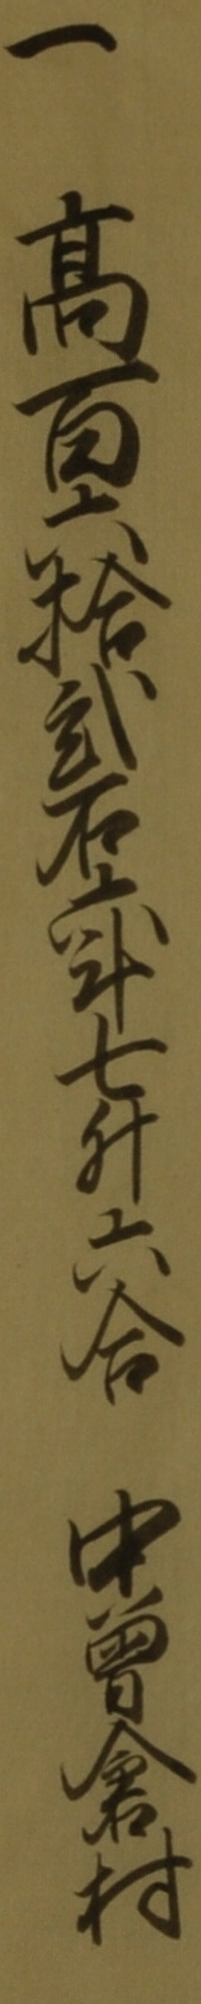一高百六拾弐石六斗七升六合中曾倉村
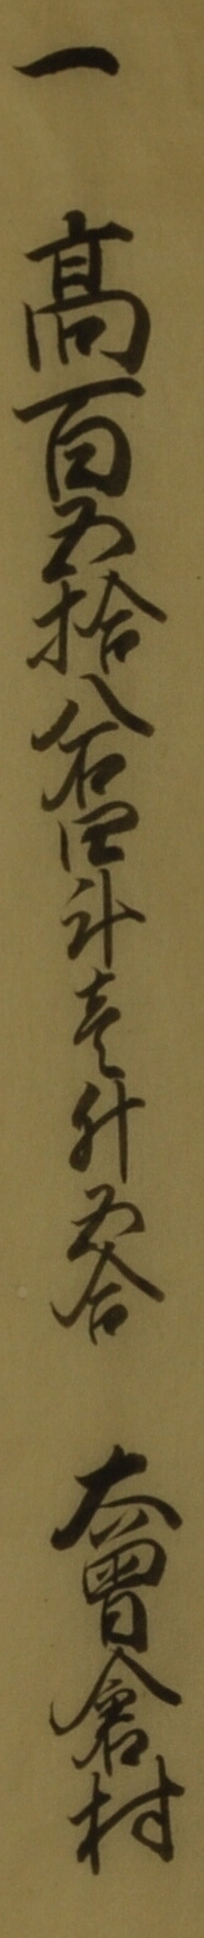一高百五拾八石四斗壱升五合大曾倉村
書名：信濃国伊那郡筑摩郡高遠領知郷村高辻帳
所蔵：伊那市立高遠町図書館・合同会社AMANE
